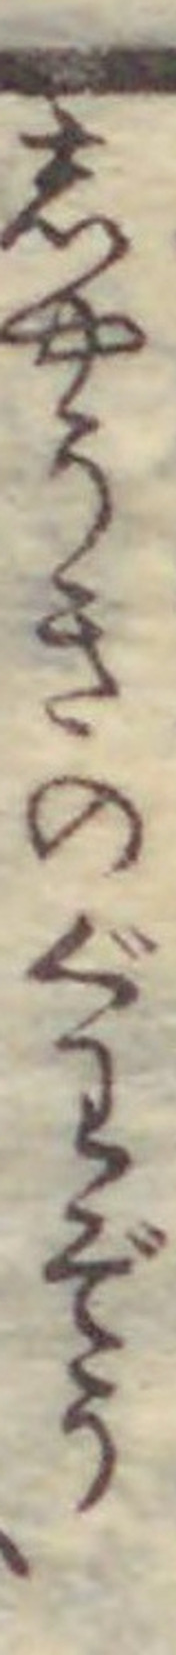しやうきのぐわぞう
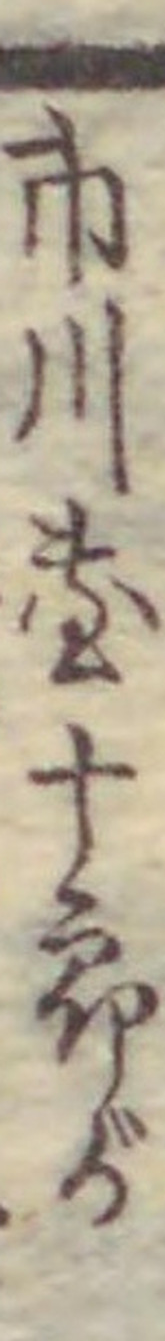市川団十郎が
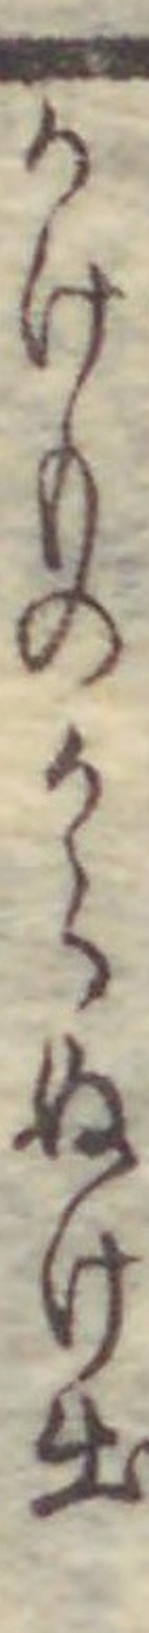かけものからぬけ出
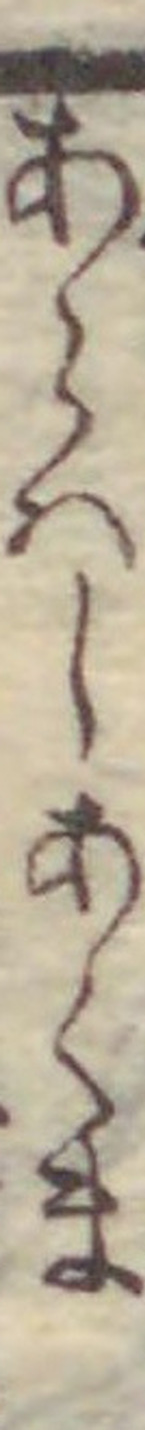あらはしあくま
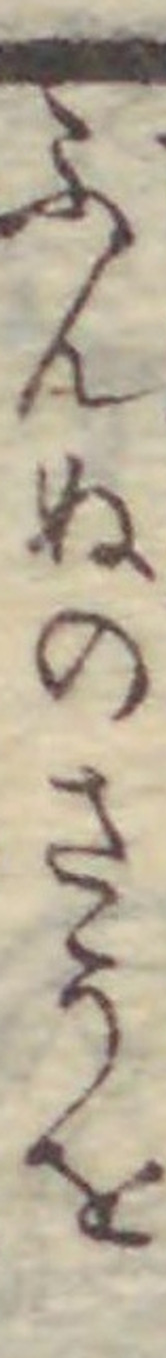ふんぬのさうを
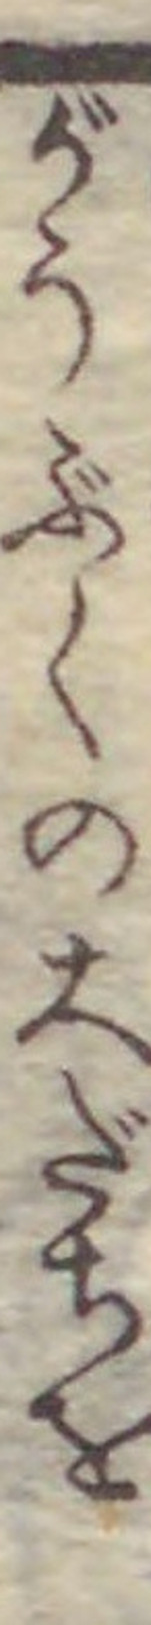がうぶくの大だちを
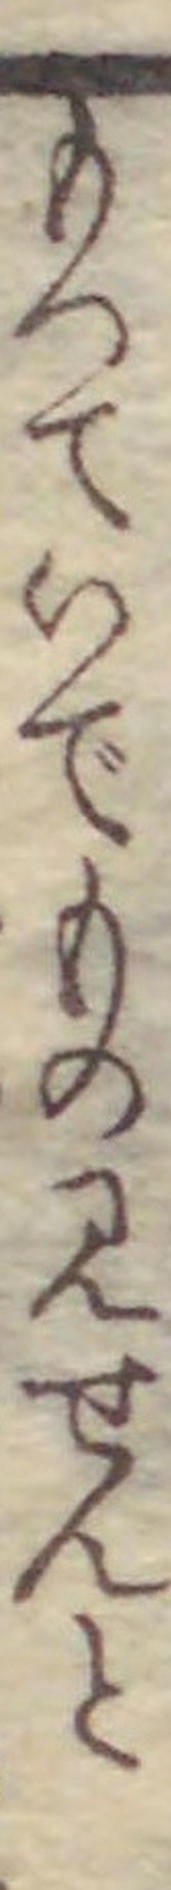もつていでもの見せんと
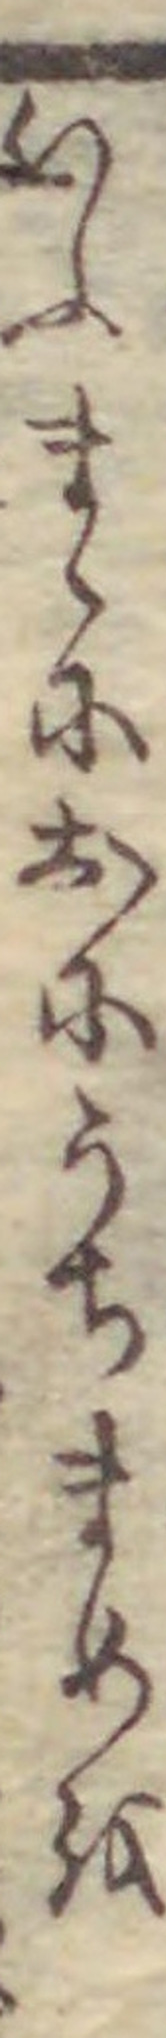いふまゝにおにうちまめを
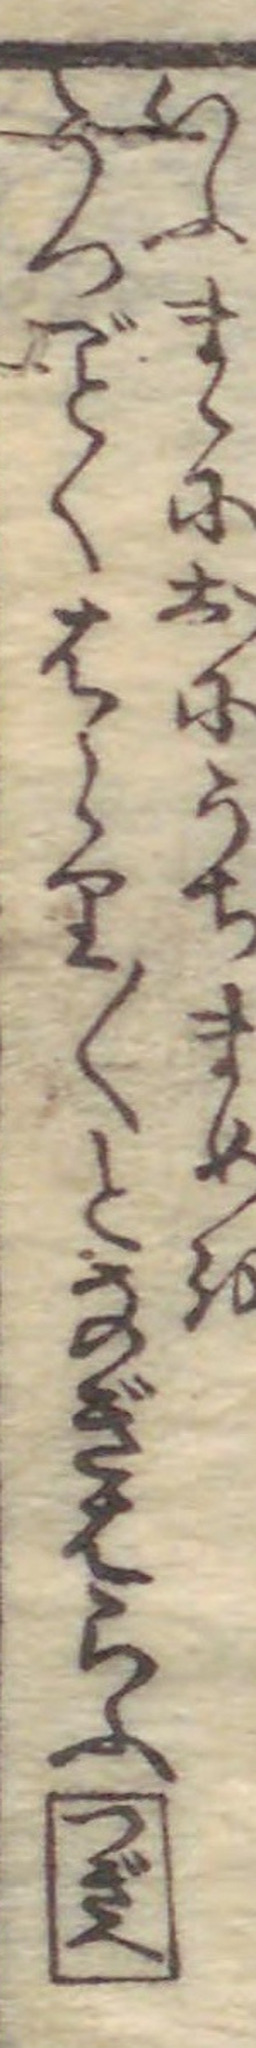うつごとくはらり〳〵となぎはらふつぎへ

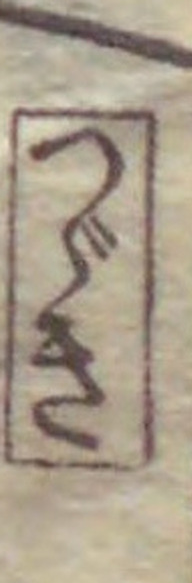つゞき
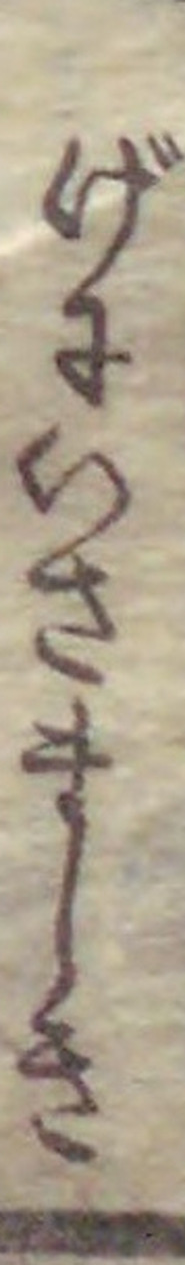げにいさましき
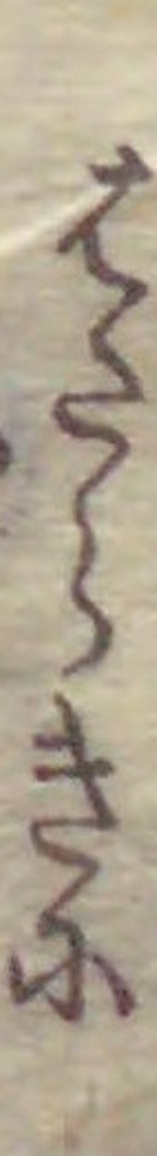はたらきに
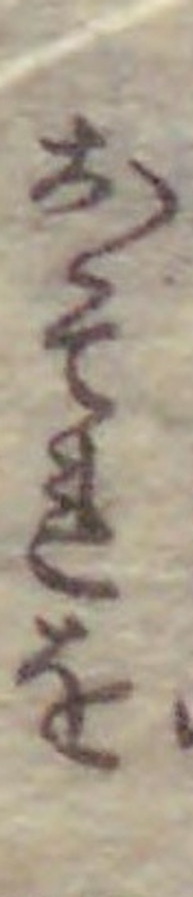おそれを
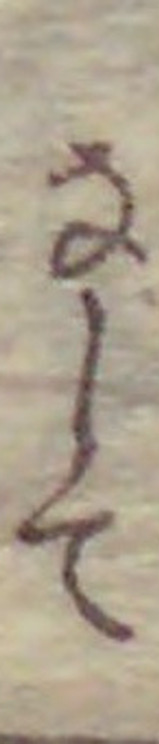なして
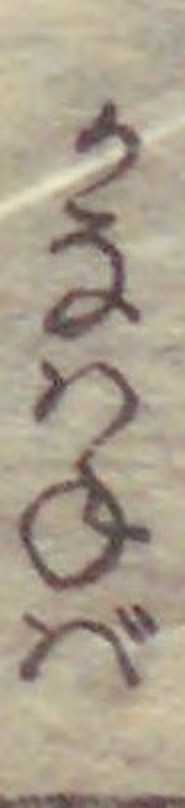かなはねば
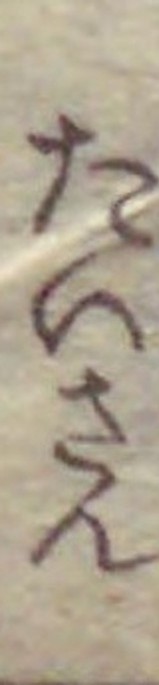たいさん
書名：大時代唐土化物 3巻. 曽我太夫染
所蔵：国立国会図書館 National Diet Library, JAPAN
